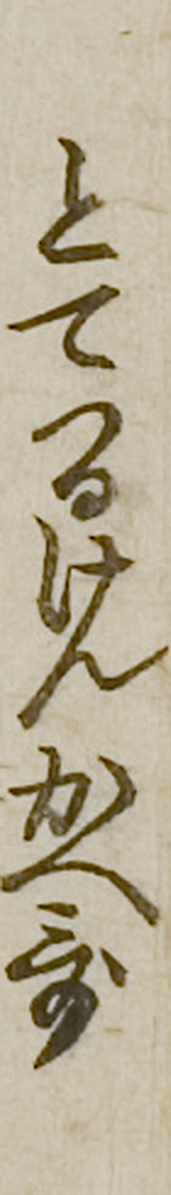とてつるけんかへ歌
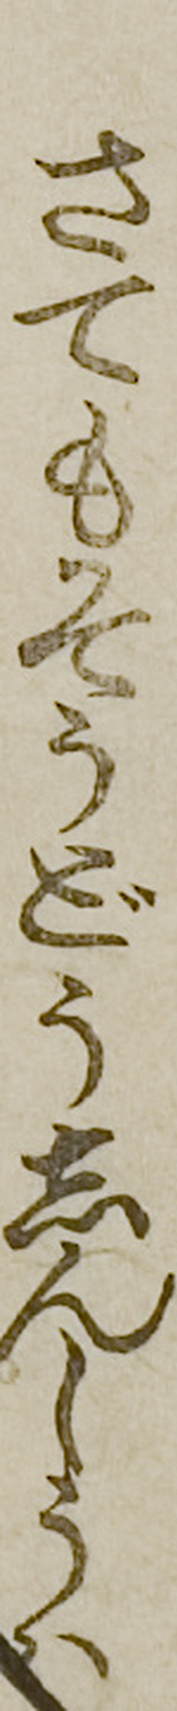さてもそうどうしんしうハ
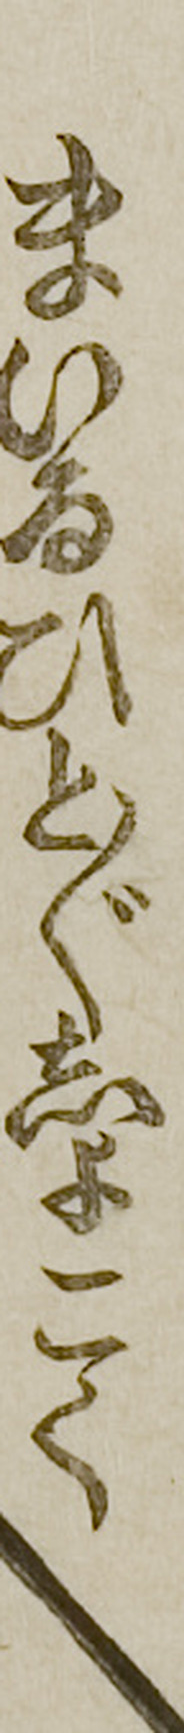まいるひと〴〵しよこく
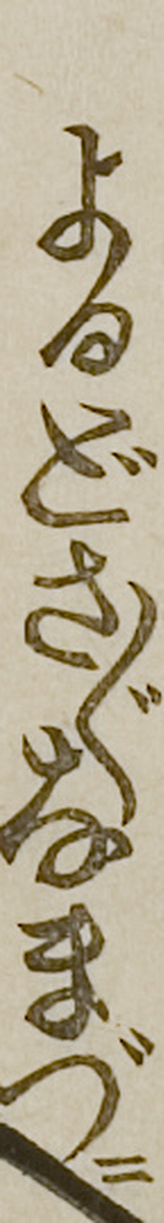よるどさ〴〵なまづニ
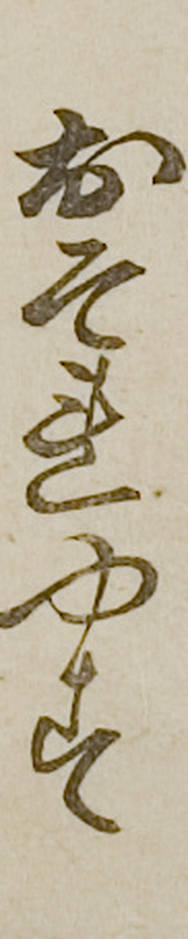おそれゆす
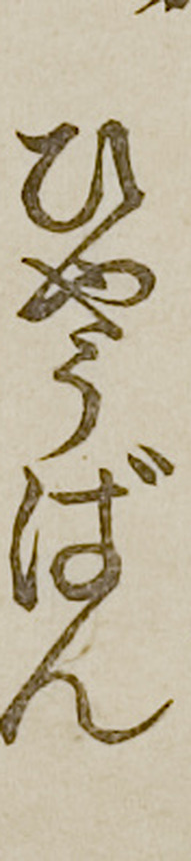ひやうばん
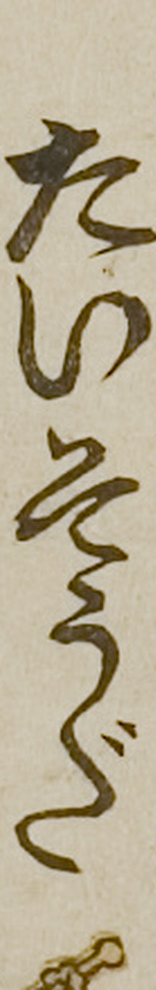たいそうだ
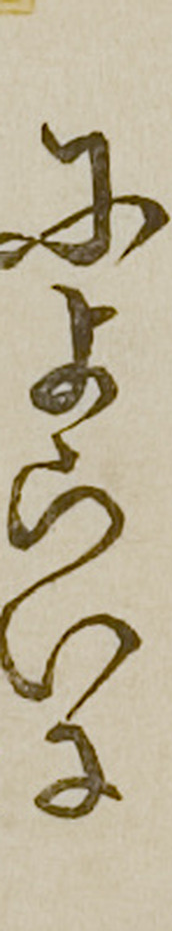によらいに
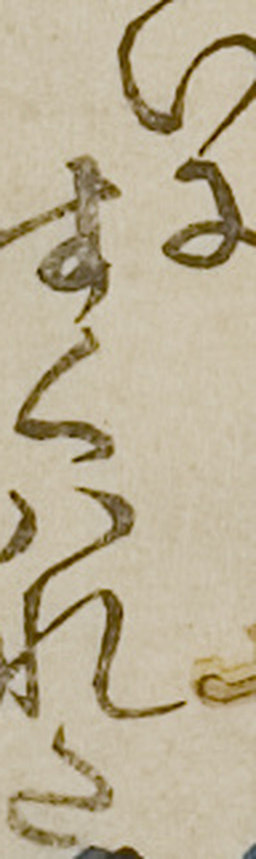すくハれた
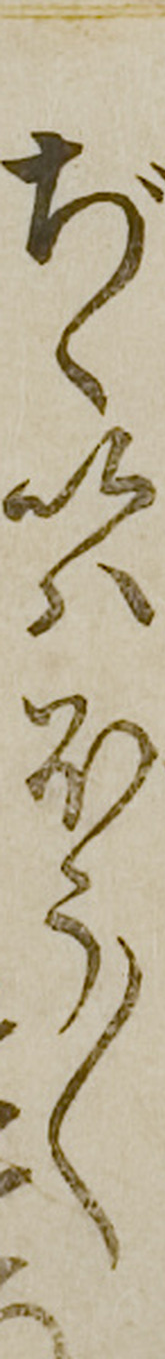ぢゝいハほう〳〵
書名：とてつるけんかへ歌
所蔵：東京大学総合図書館 General Library in the University of Tokyo, JAPAN
